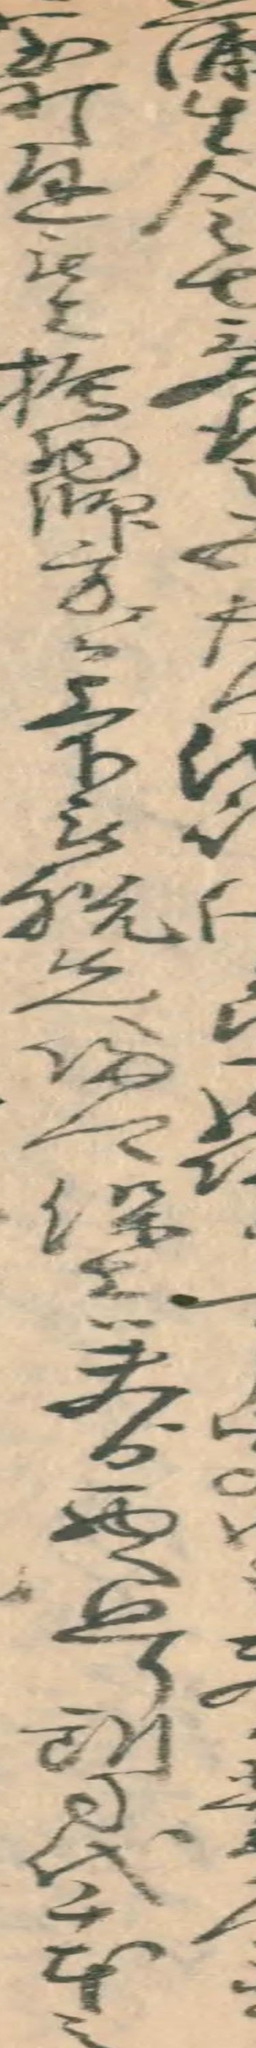室町通被上檜物師方ニ而上下被脱先へ帰郷保土ハ夫ゟ西へ廻り所司代千本之
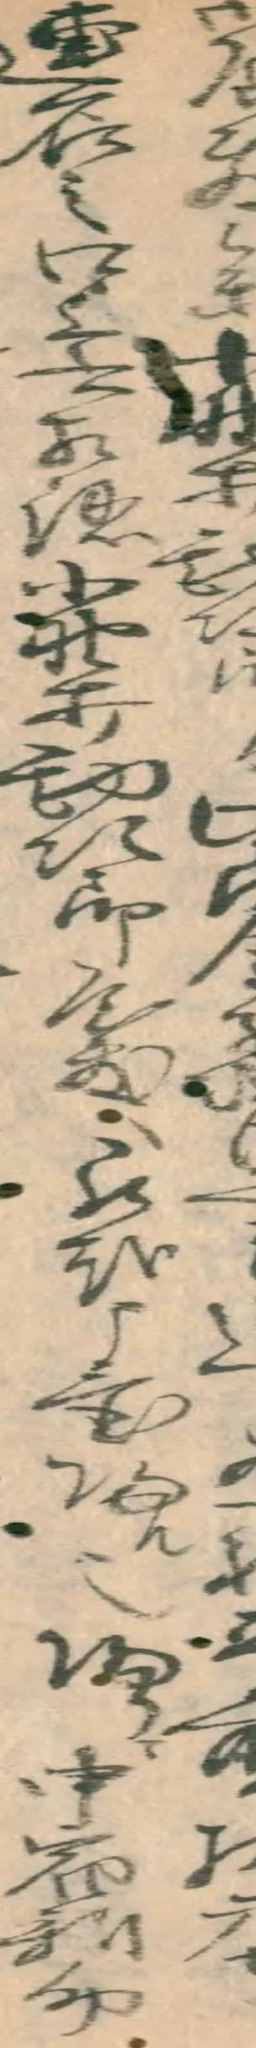連名之口上書相認小野打勘次郎屋敷へ罷越申置帰ル也帰りニ中宿新助
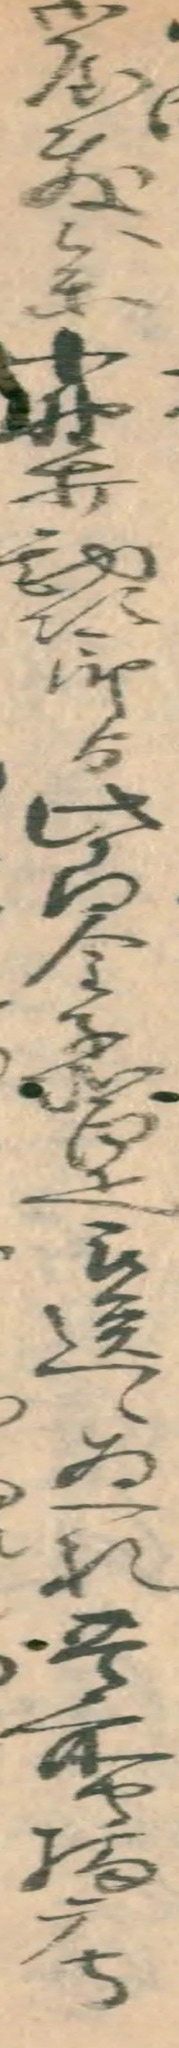御屋敷へ参小野打勘次郎ゟ此間金子弐百疋被送候為一礼豊前守播磨守
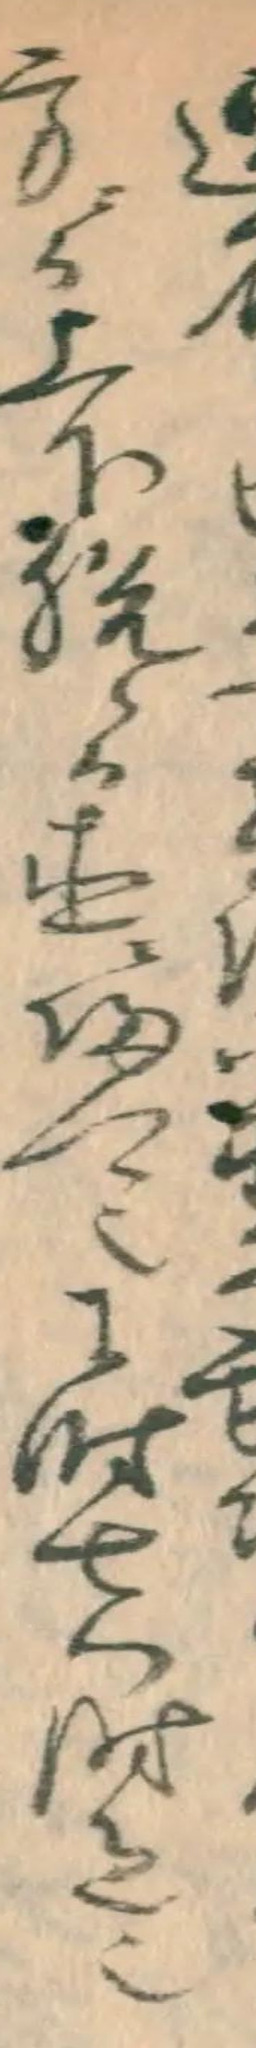方ニ而上下脱候而直ニ帰郷也于時七ツ時過也
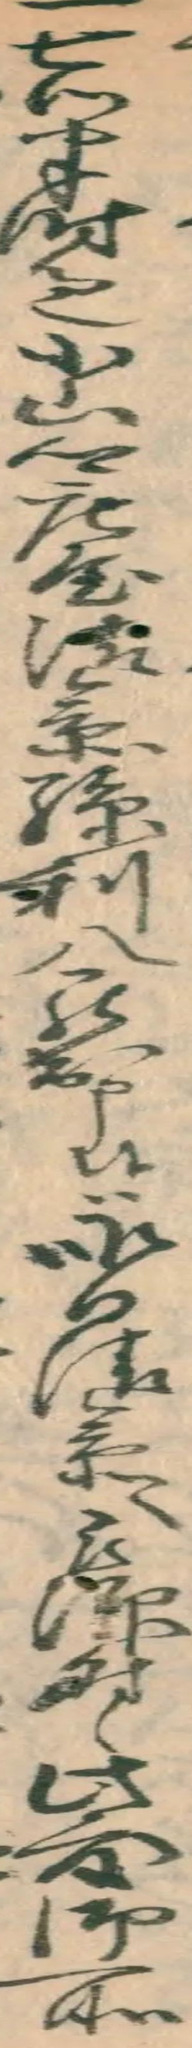一七ツ半時過小山卿庄屋清兵衛孫利八罷出申候ハ昨日清兵衛へ被仰付候此度御所
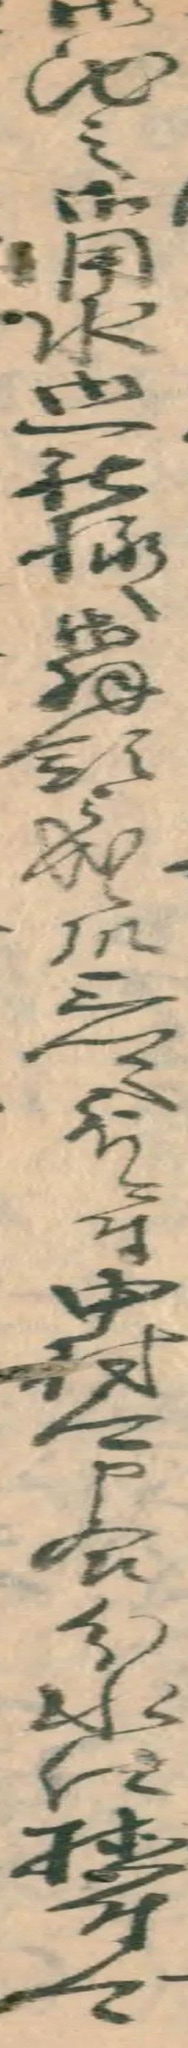御池之御用水御一社様へ御拝領被成候段三郷へ被下ニ付中村郷申合分水仕植付可
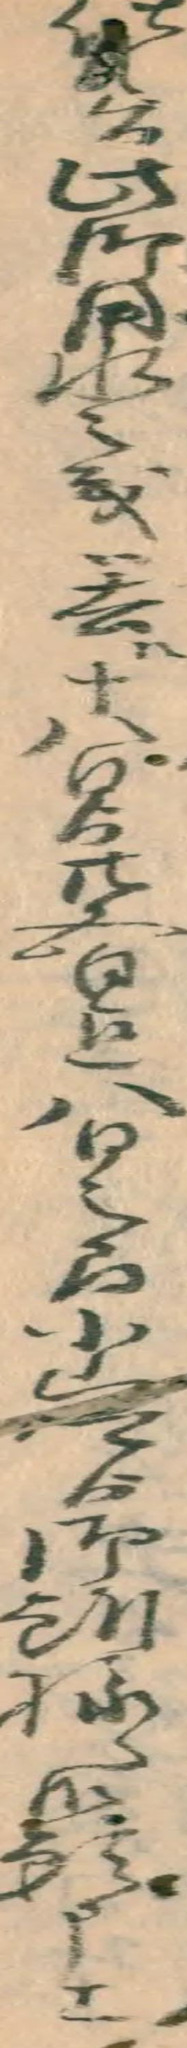仕之旨此御用水之義ハ去ル十八日ゟ廿五日迄八日之間小山郷ゟ御所様へ御願申上
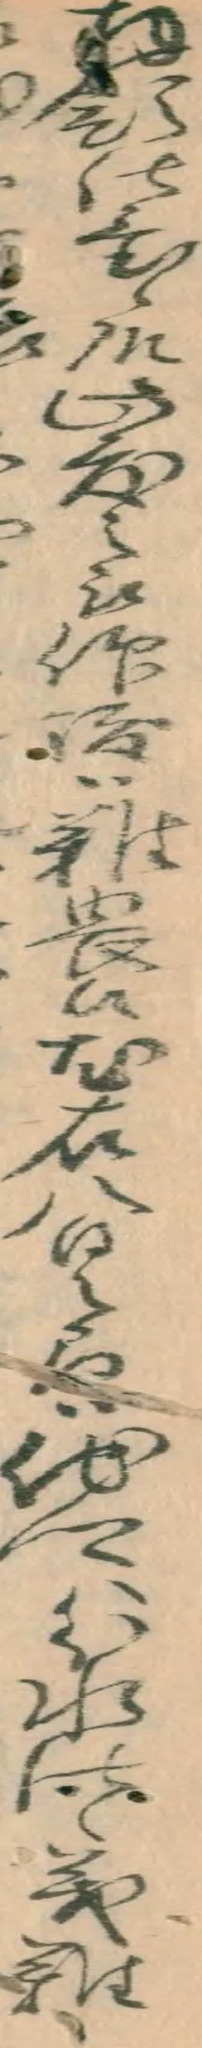拝領仕置候故此度之被仰渡ハ難畏候尤右八日之間ハ他郷へ分水仕候義難
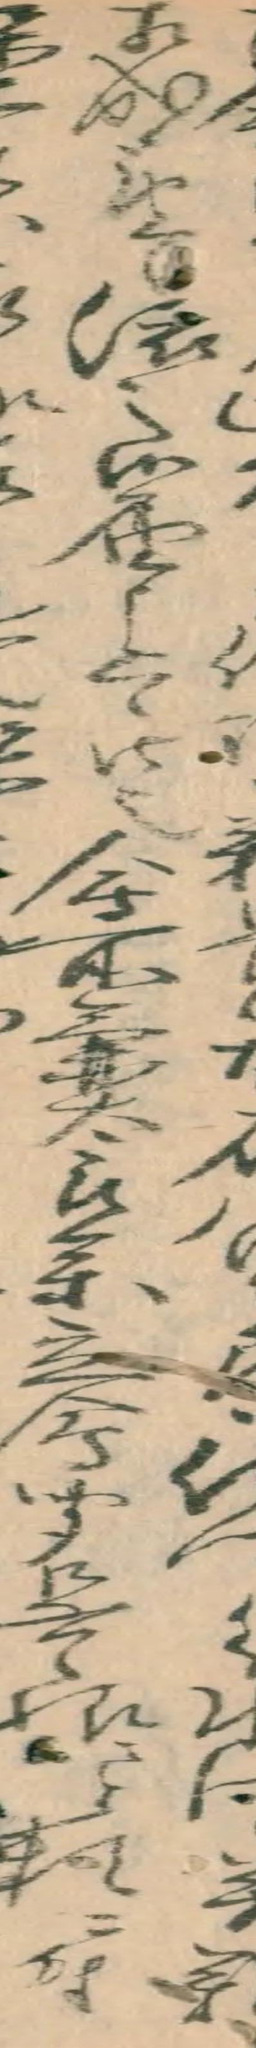相成御座候依之御届申上候由也会所兼太被参立会聞呉候様ニと頼ニ付
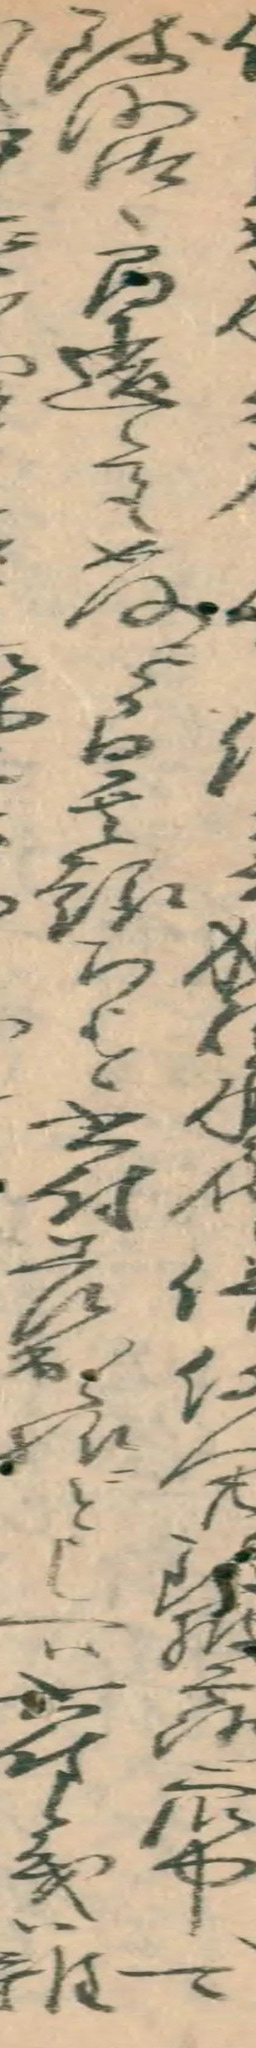致沙汰候間違候ても如何ニ候間其趣ちよと書付差出候様ニと申候へハ書付之義ハ難
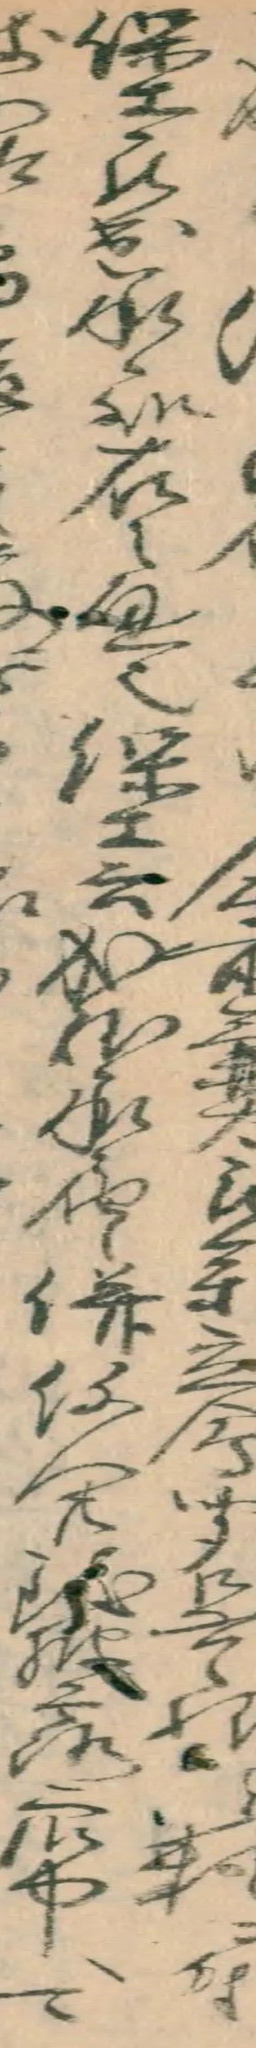保土罷出承候処右之通也保土云成程承届候併役人共致披露最中へ可
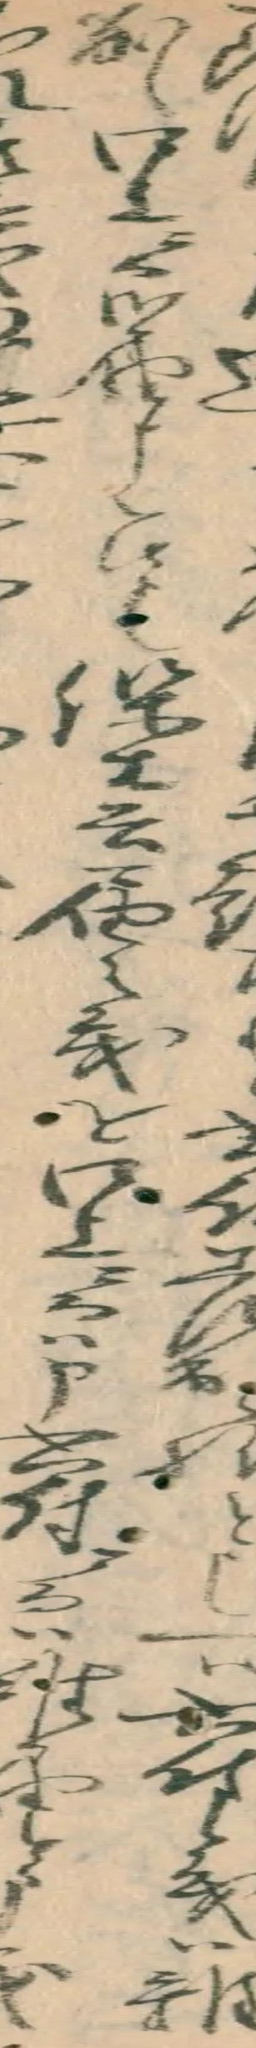成候口上ニ而御届申之由申候保土云届之義を口上ニ而ハ申書付ニ而ハ難届と申義
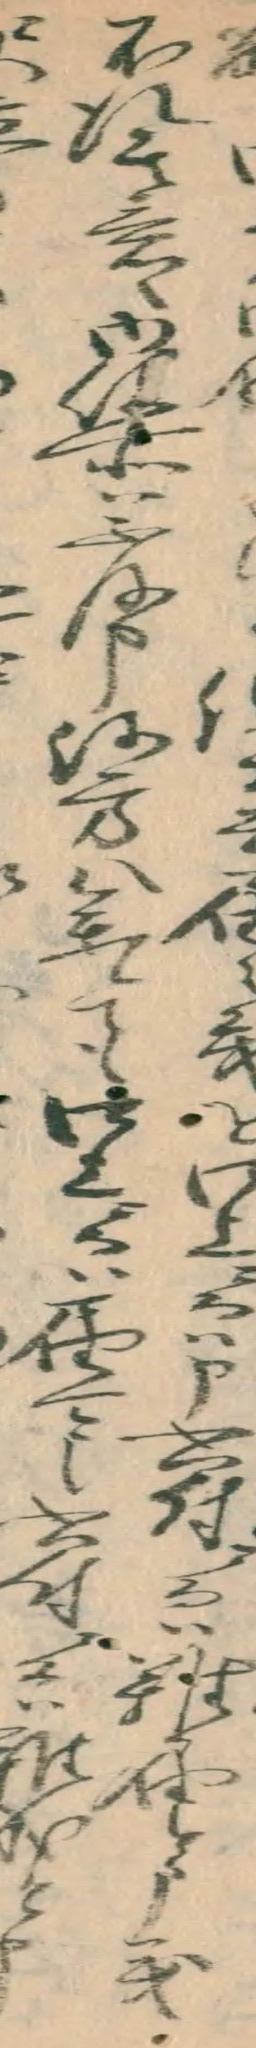不得其意候御役所ハ不及申何方へ参候ても御上ニ而ハ届可申候書付ニ而ハ難成と申
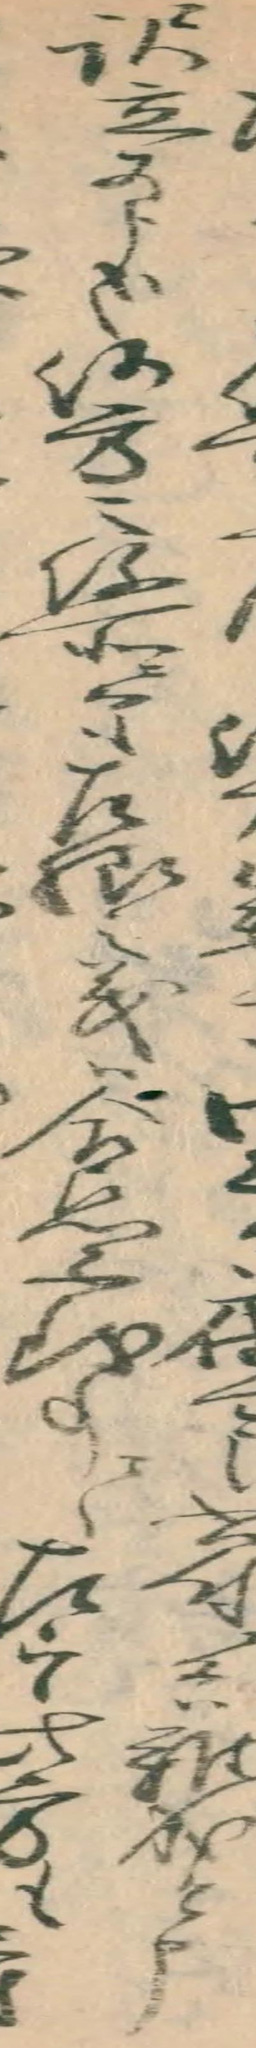訳立可申哉何方之役所ニ而も左様之義ハ合点不致事ニ候左候ハヽ此方も書付
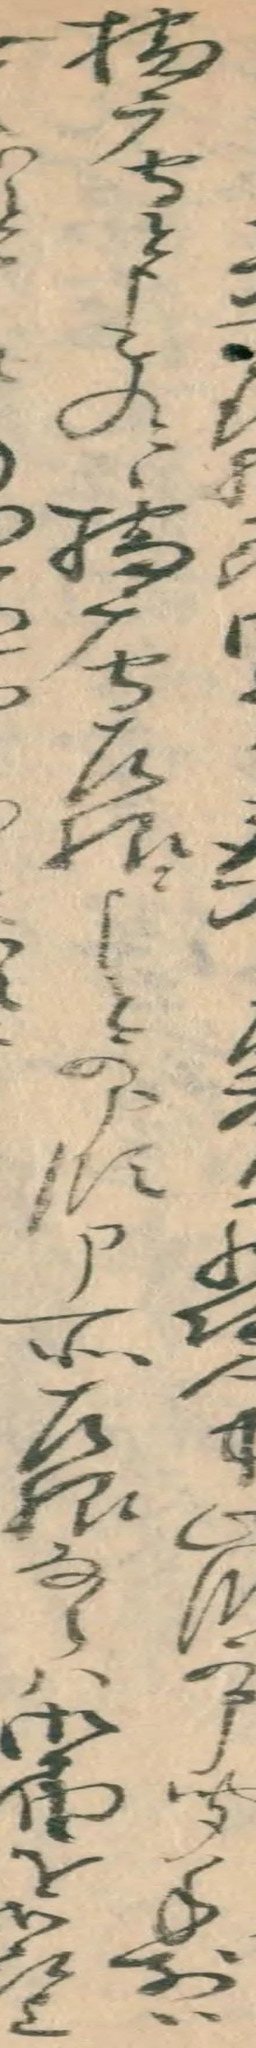播磨守と申ものニ候播磨守左様ニ申と可申段申所左様ならハ御届を御取上
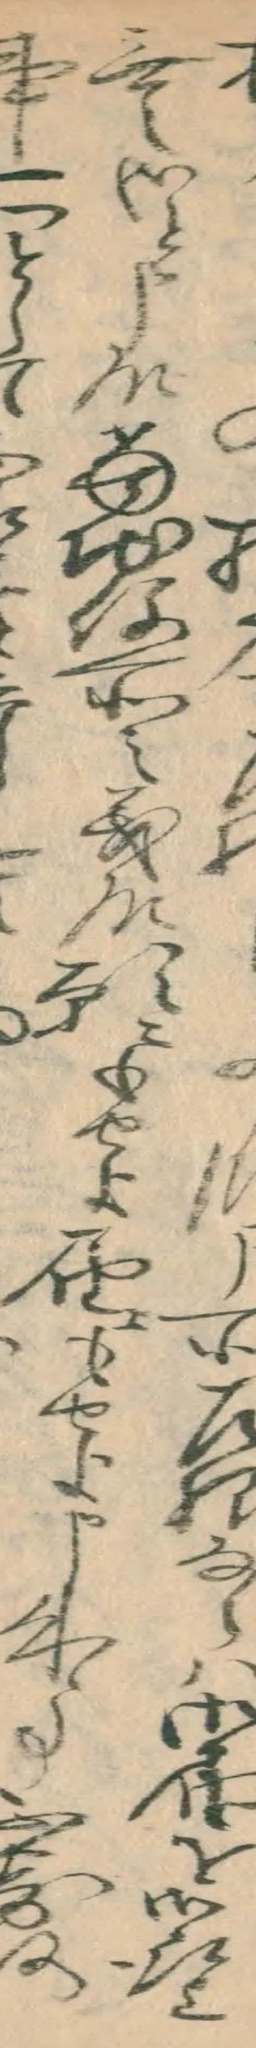無之哉と申故当地役所之義故願ニもせよ届ニもせよ申来候事不寄何
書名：賀茂社記録. 第58冊
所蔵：国立国会図書館 National Diet Library, JAPAN
